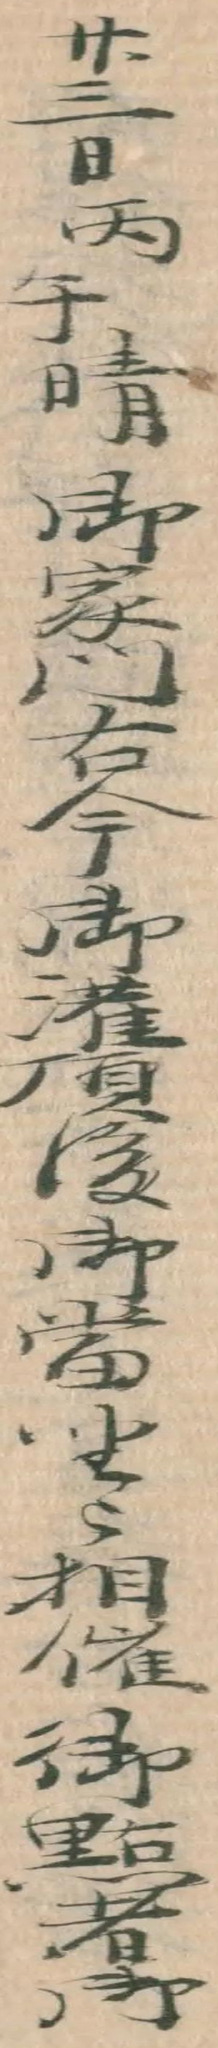廿三日丙午晴御家門古今御灌頂後御當坐被相催御點者御
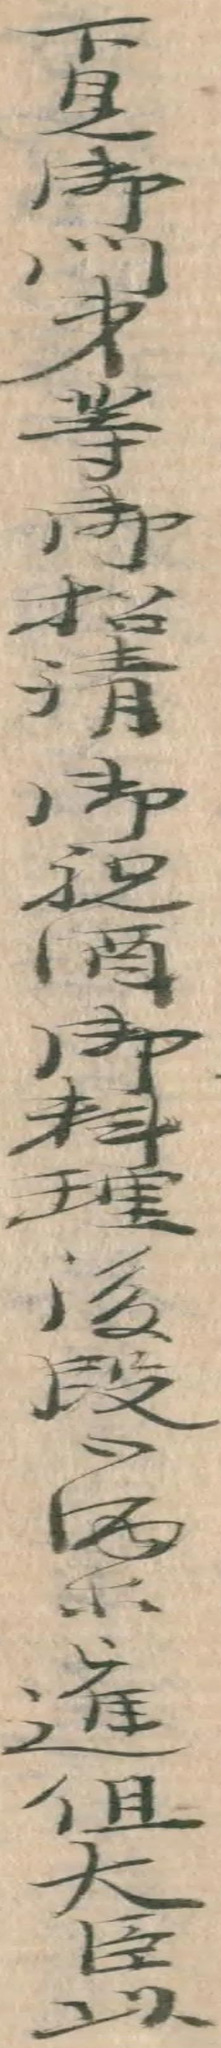下見御門弟等御招請御祝酒御料理後段御酒等被進但大臣以
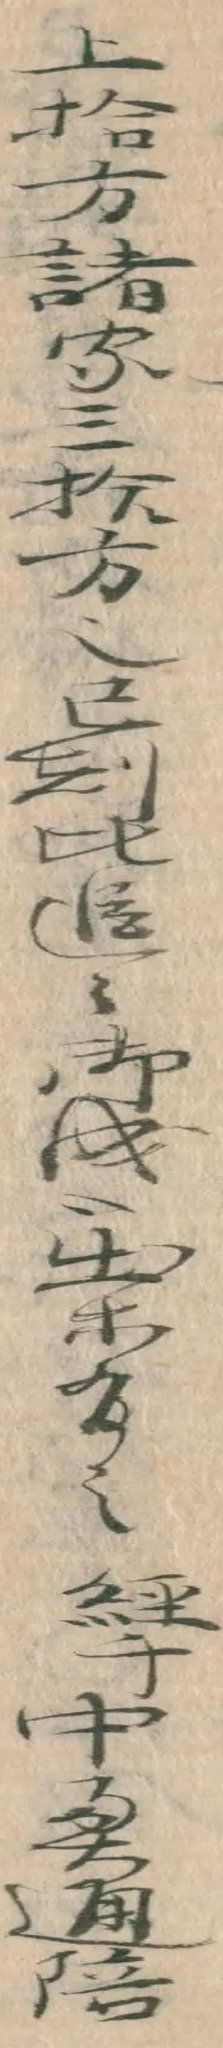上拾万諸家三拾方也巳刻比追々御成御出等有之経干中通陪
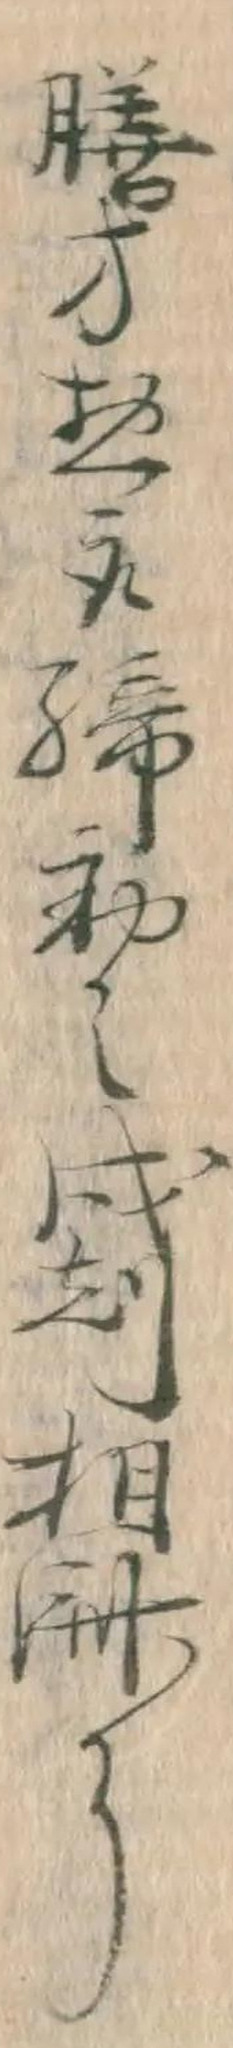膳方惣取締勤之戌刻相済了
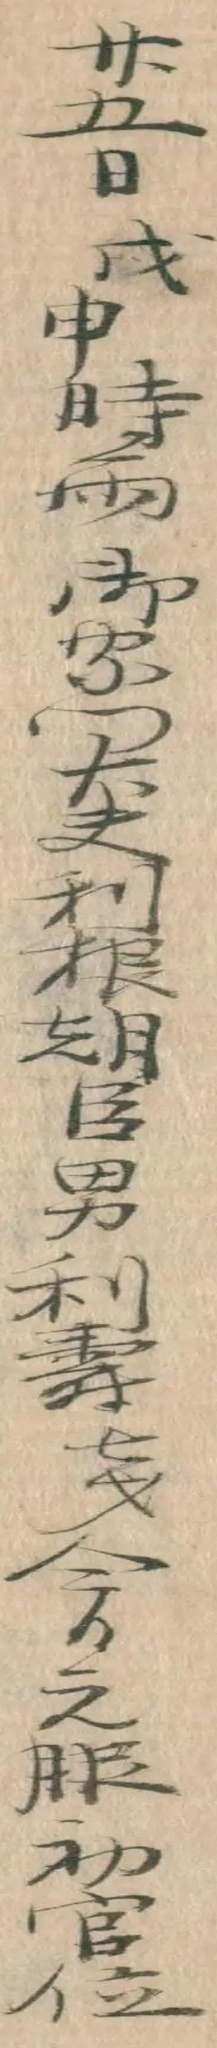廿五日戊申時雨御家門大夫利根朝臣男利壽七才今日元服初官位
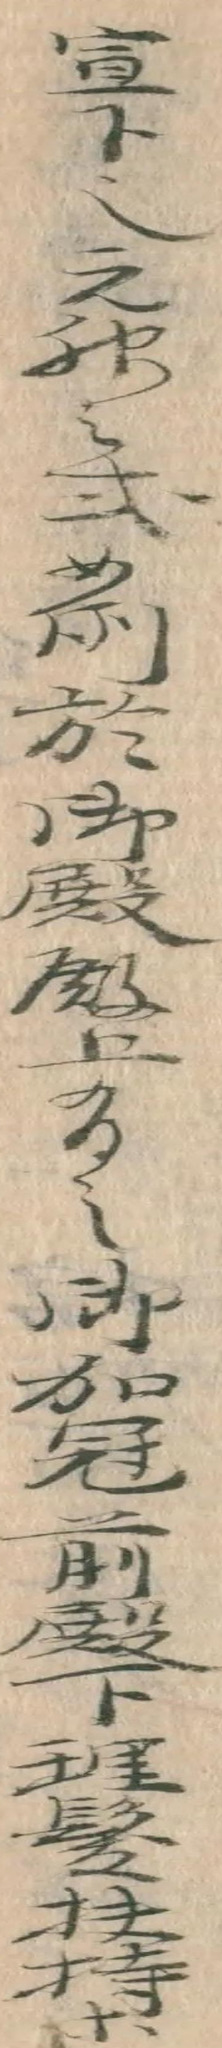宣下也元服之式如例於御殿殿上有之御加冠前殿下理髪扶持等
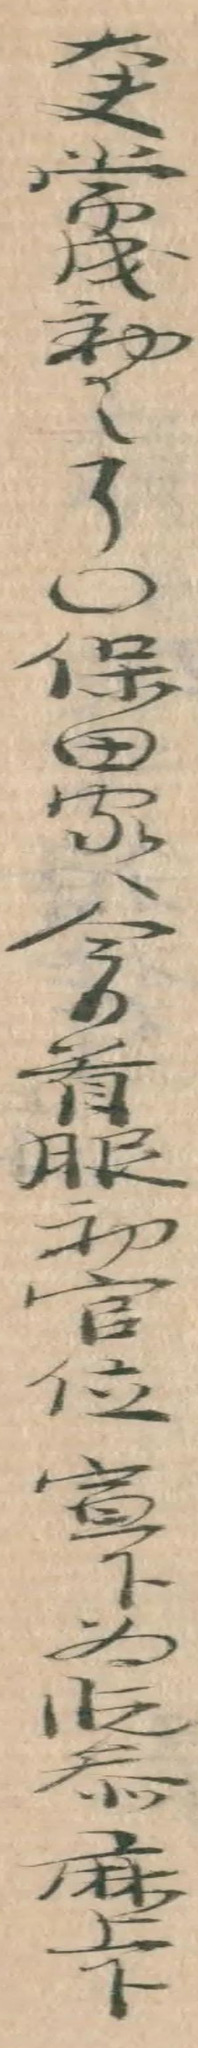大夫常成勤之了〇保田家へ今日首服初官位宣下為段参麻上下
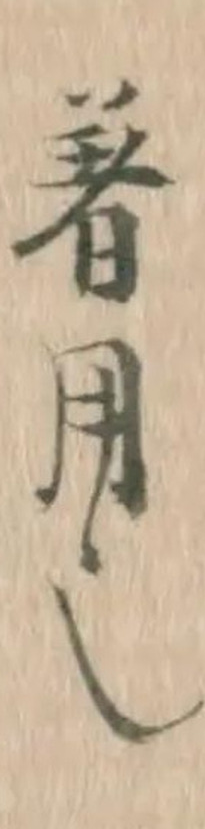着用也
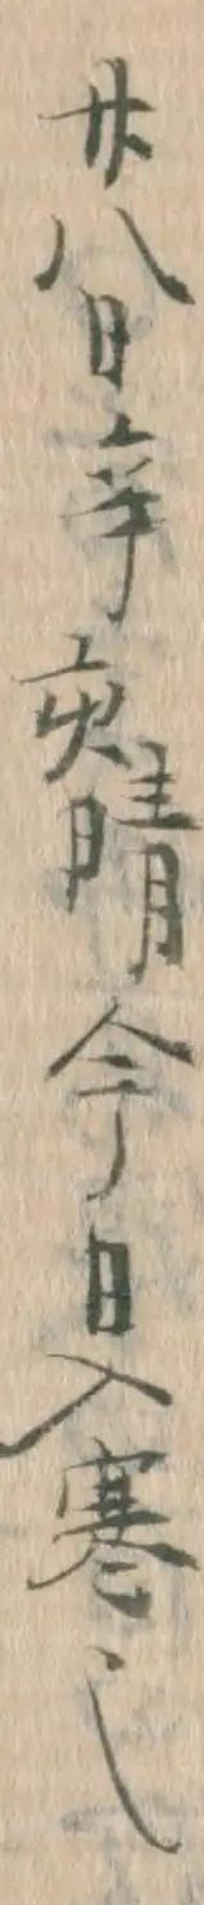廿八日辛亥晴今日入寒也
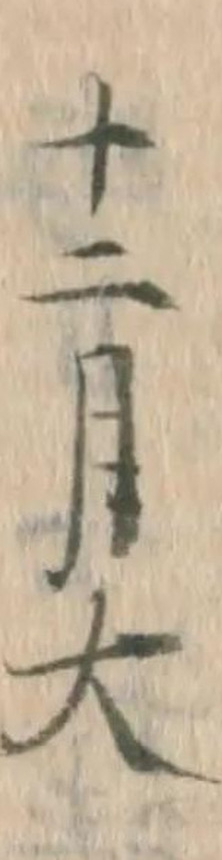十二月大
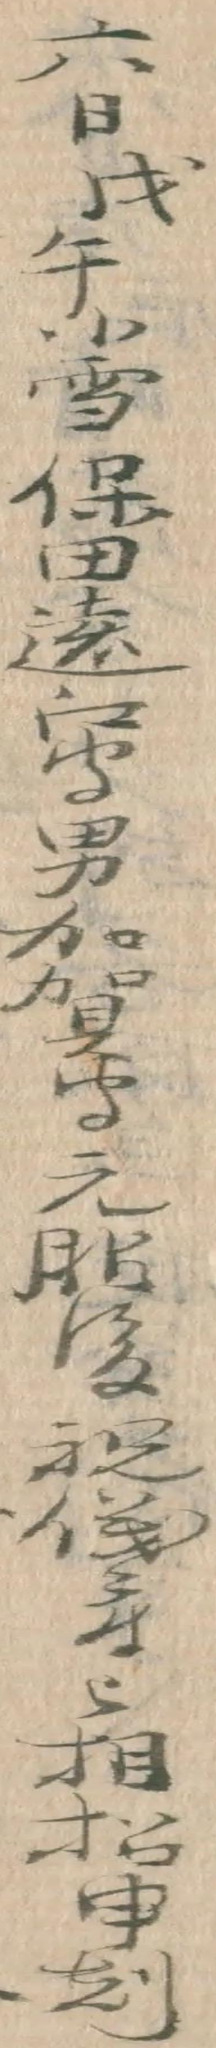六日戊午小雪保田遠江守男加賀守元服後祝儀ニ付被相招申刻
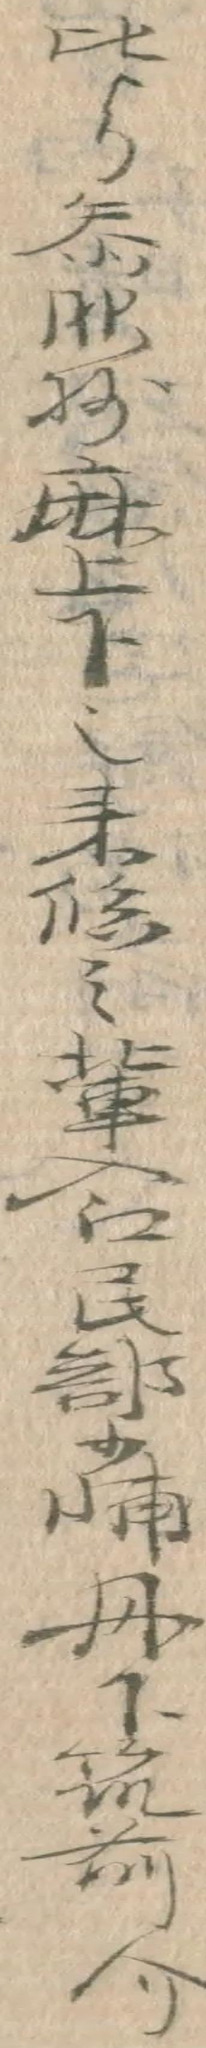比より参眼抄麻上下之来臨之輩入江民部少輔丹下筑前介
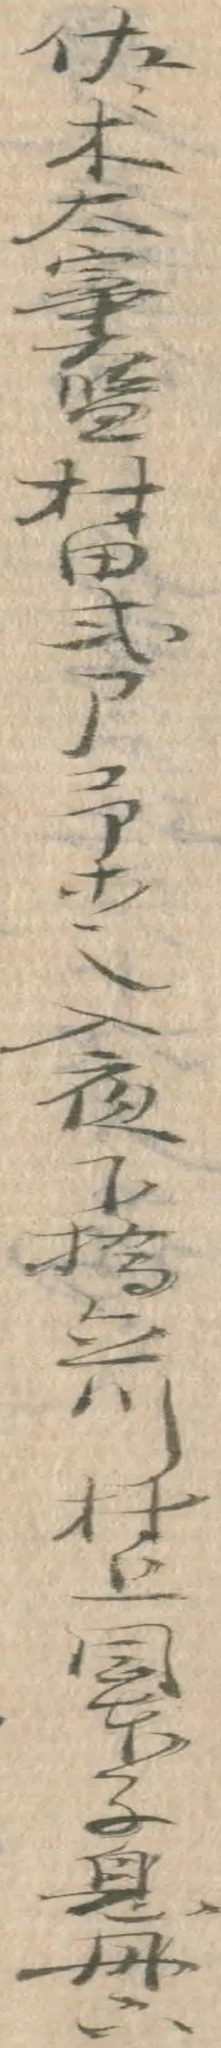佐々木太宰監村田式部予等也入夜下橋立川村上岡本子息丹下
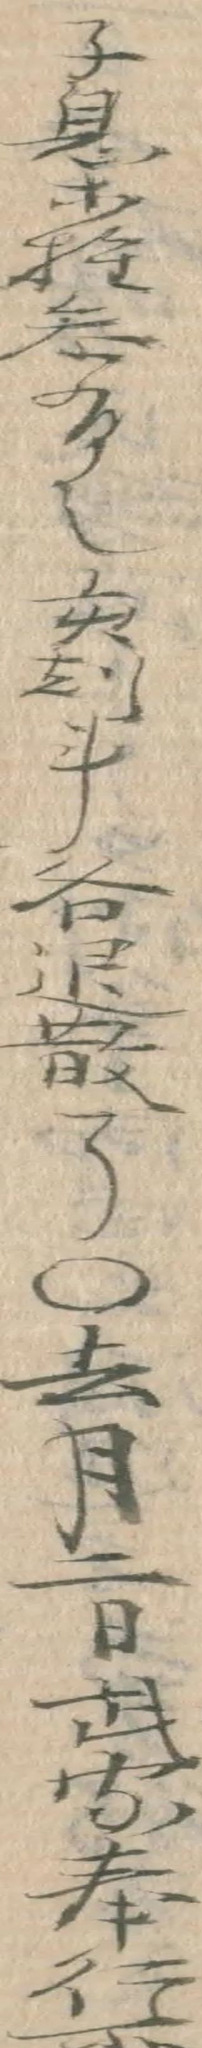子息等給参有之亥刻斗各退散了○去月二日武家奉行所
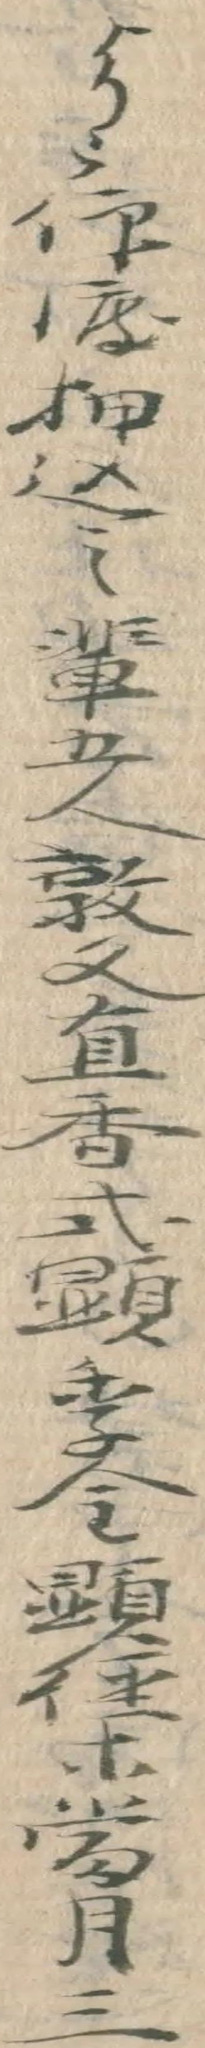より被仰渡押込之輩五人敦久直香式顕季金顕径等當月三
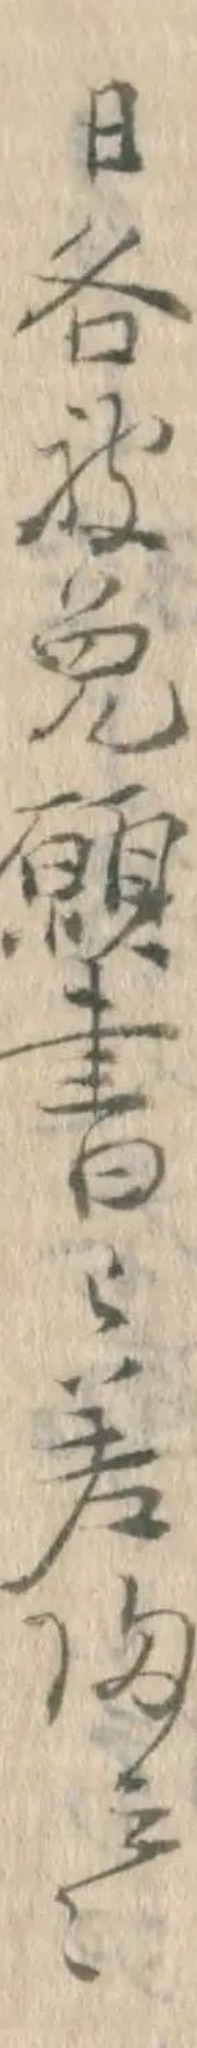日各被免願書被差帰云々
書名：賀茂社記録. 第65冊
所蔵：国立国会図書館 National Diet Library, JAPAN
